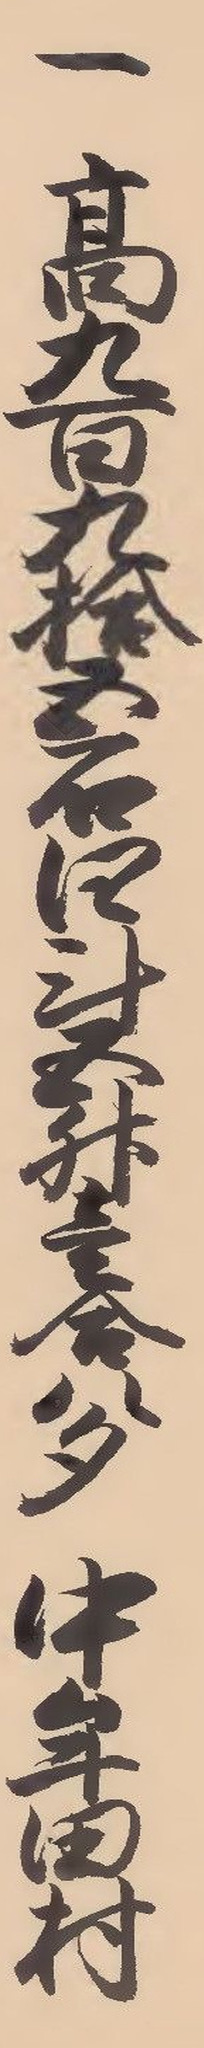一高九百九拾五石四斗五升壱合八勺中牟田村
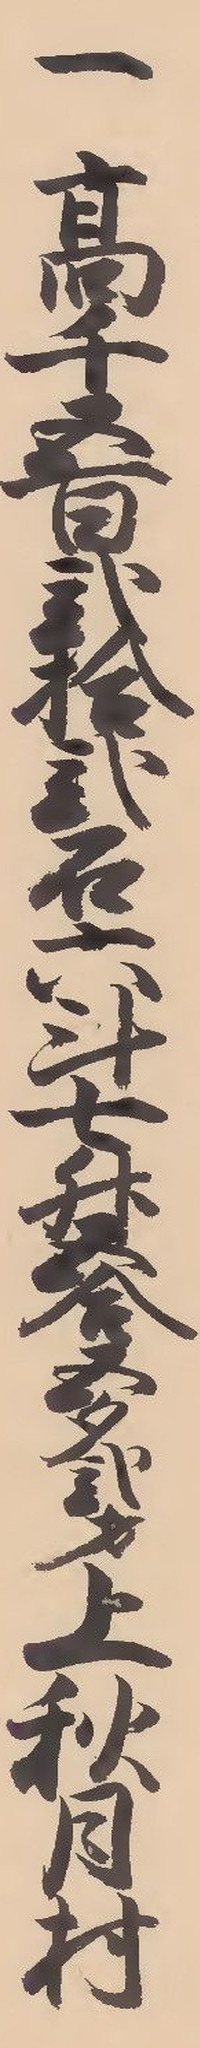一高千五百弐拾弐石六斗七升五合五勺弐才上秋月村

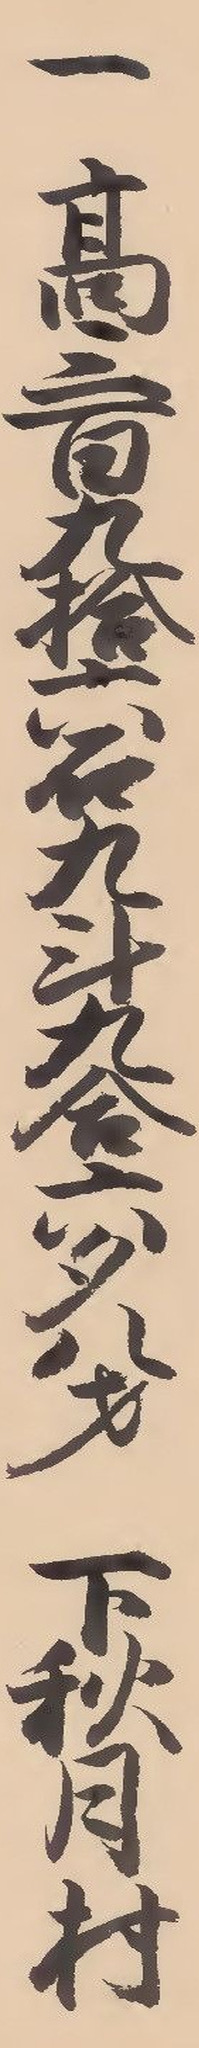一高三百九拾六石九斗九合六勺八才下秋月村
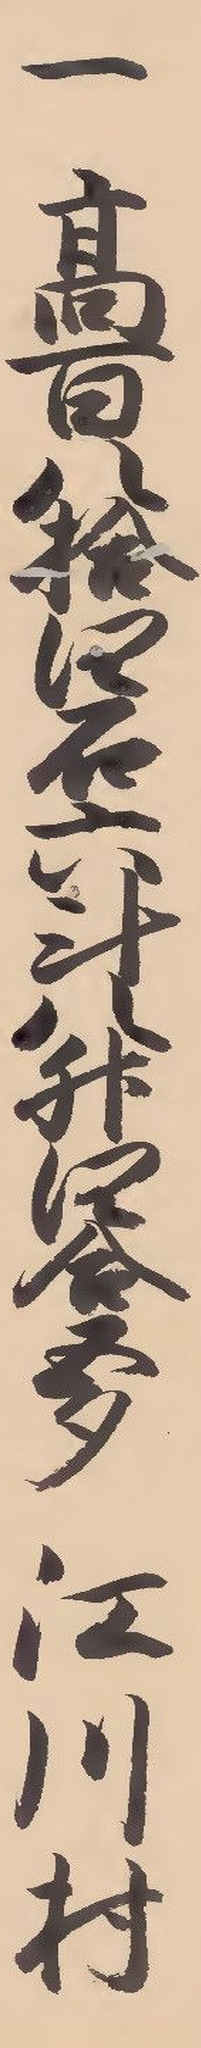一高百八拾四石六斗八升四合五勺江川村
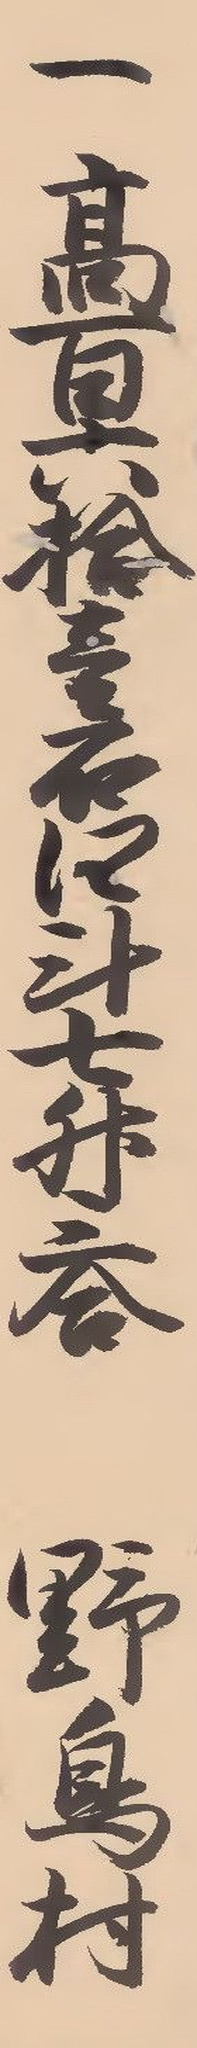一高百六拾壱石四斗七升三合野鳥村
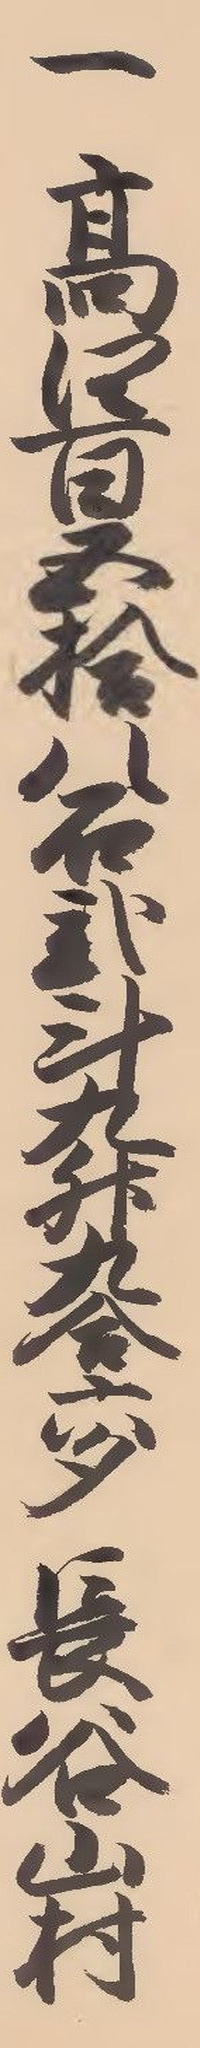一高四百五拾八石弐斗九升九合六勺長谷山村
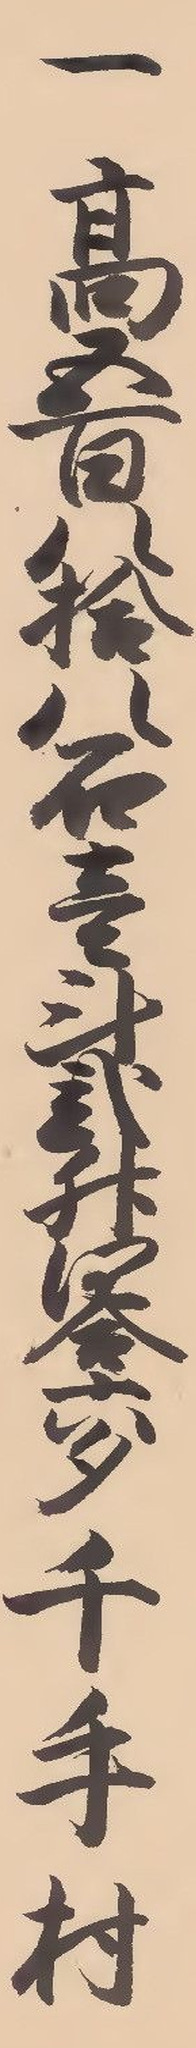一高五百八拾八石壱斗弐升四合六勺千手村
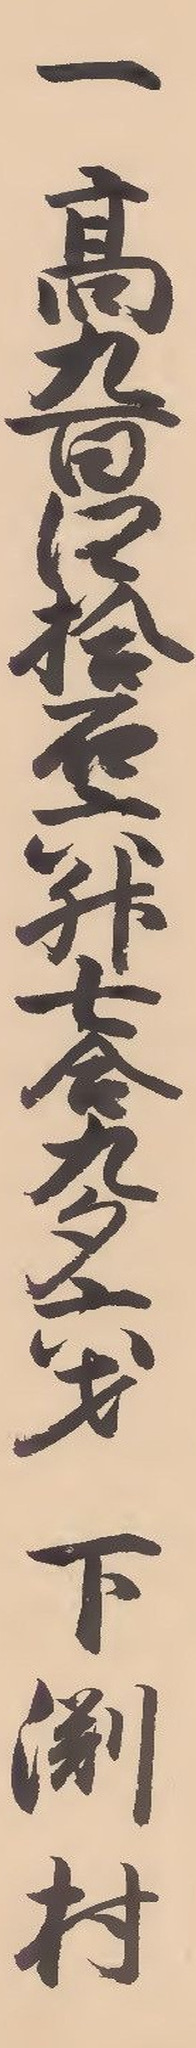一高九百四拾石六升七合九勺六才下渕村

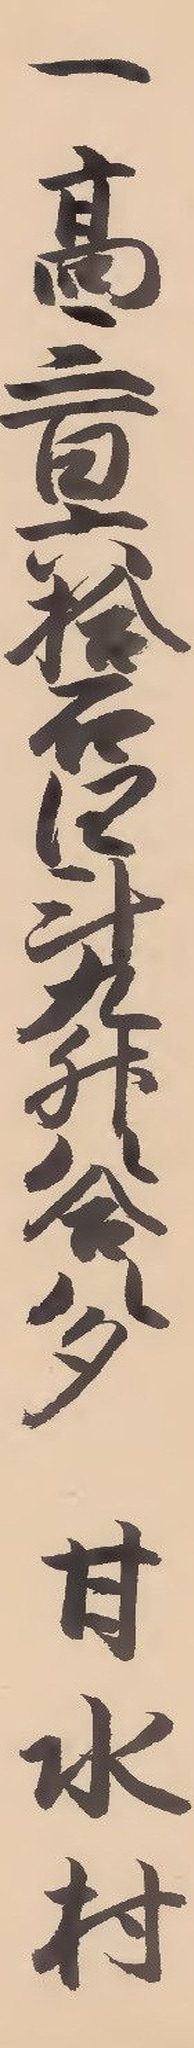一高三百六拾石四斗九升八合八勺甘水村
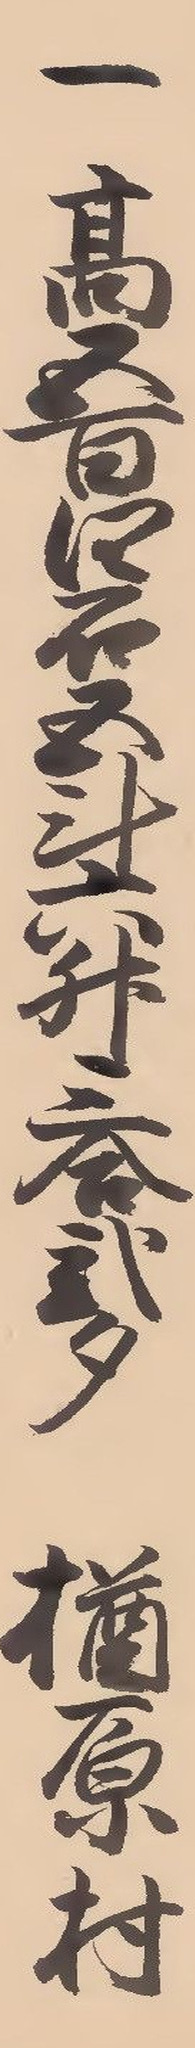一高五百四石五斗六升三合弐勺猶原村
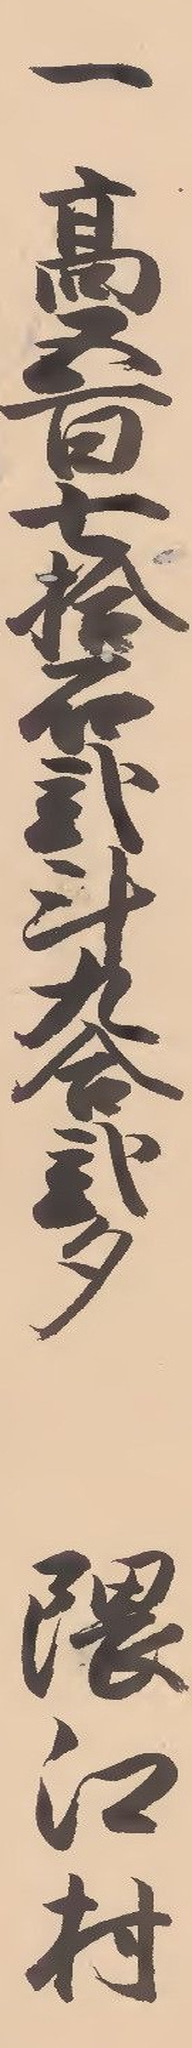一高五百七拾石弐斗九合弐勺隈江村
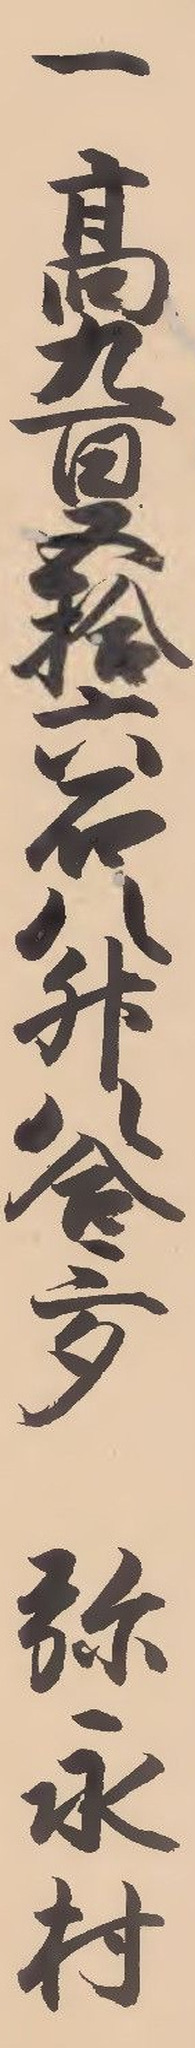一高九百五拾六石八升八合三勺弥永村
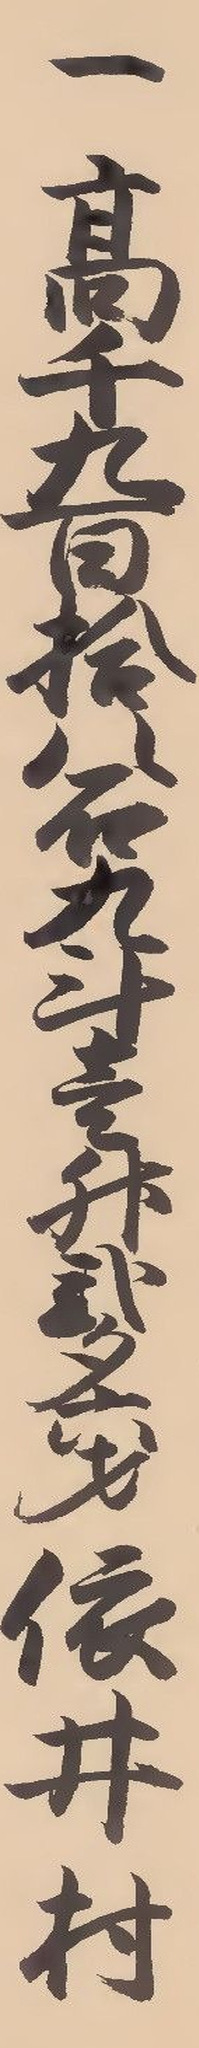一高千九百拾八石九斗壱升弐勺六才依井村
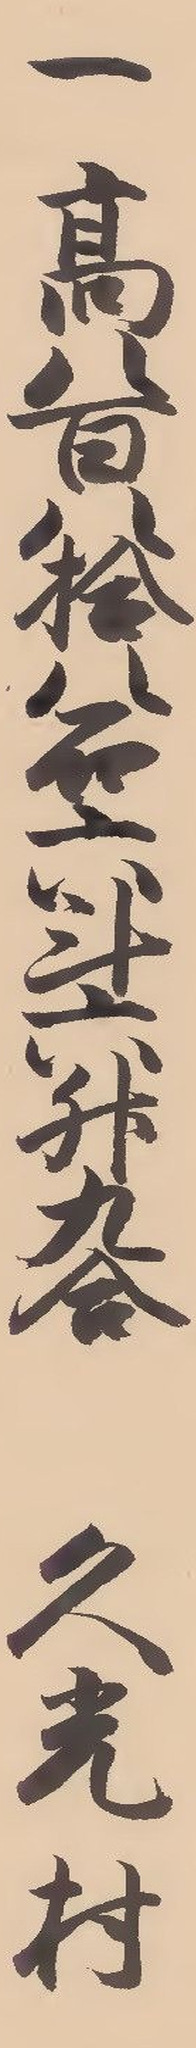一高八百八拾八石六斗六升九合久光村

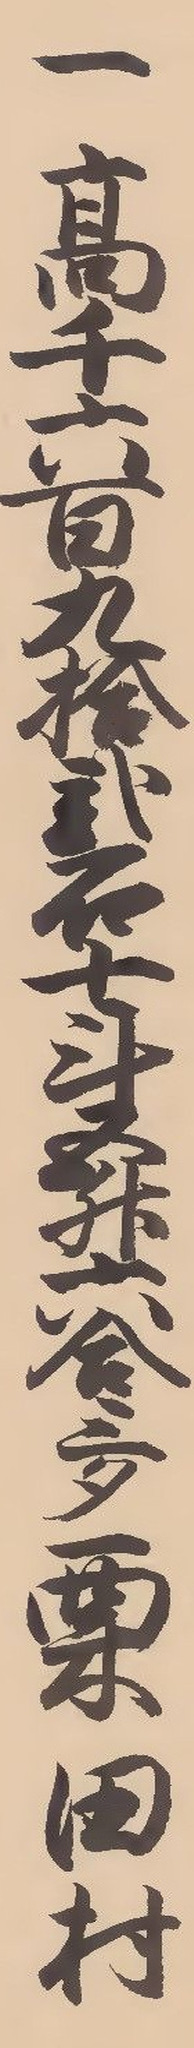一高千六百九拾弐石七斗五升六合三勺栗田村
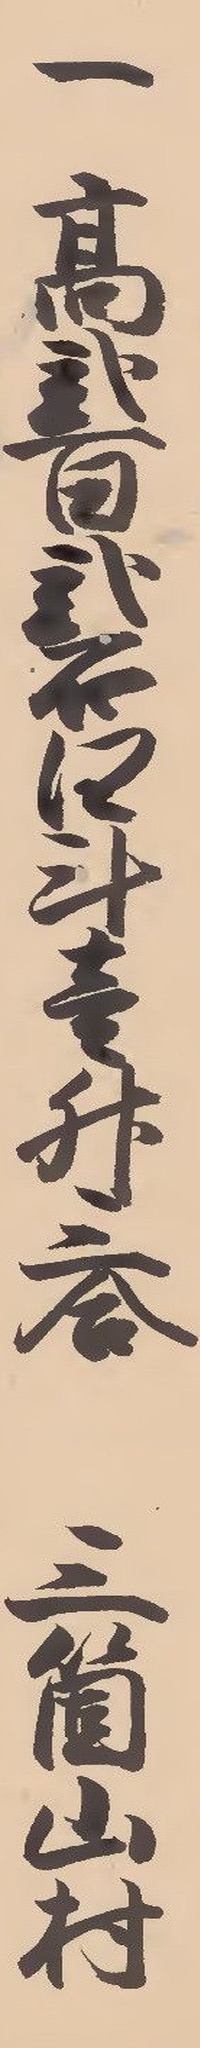一高弐百弐石四斗壱升三合三箇山村
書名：筑前国郷帳
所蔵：国立公文書館 National Archives of Japan
